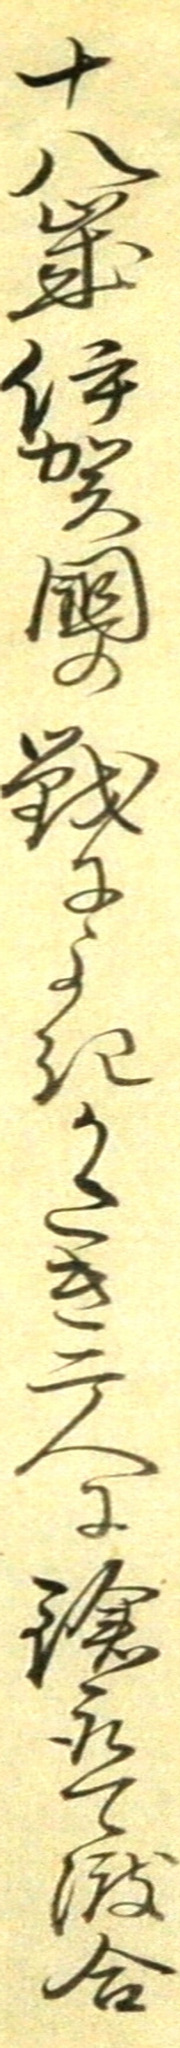十八歳伊賀国の戦によきかたき二人に鎗取て渡合
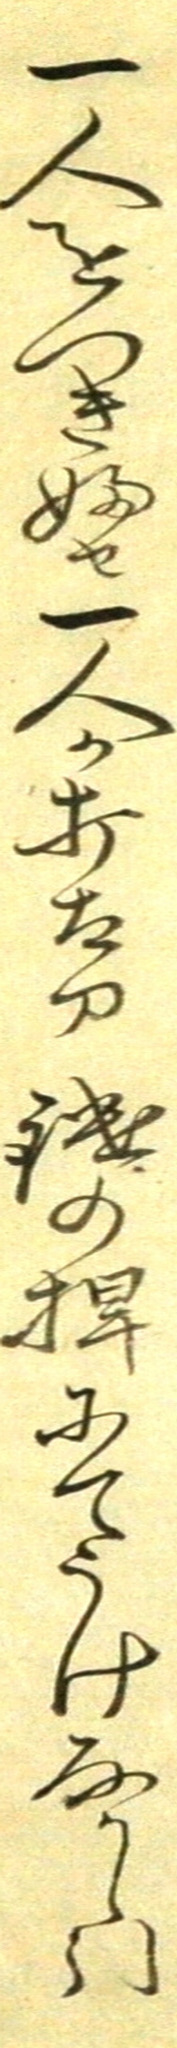一人をつきふせ一人か打太刀鑓の捍にてうけなかし引
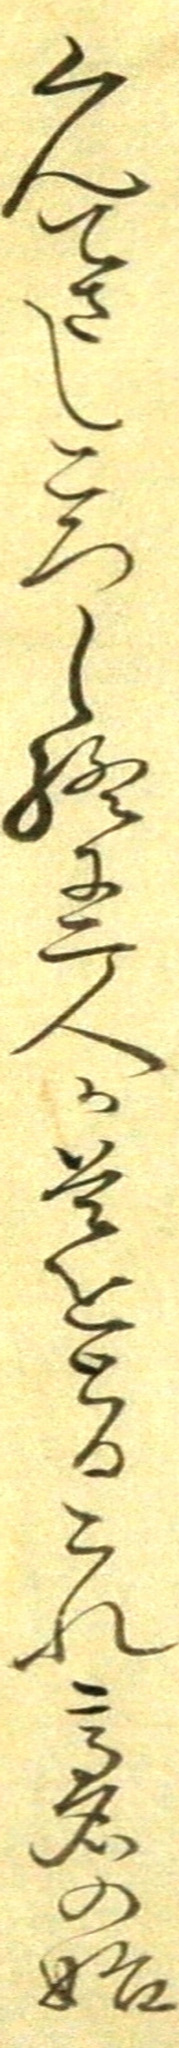くんてさしころし終に二人か首をとるこれ高名の始
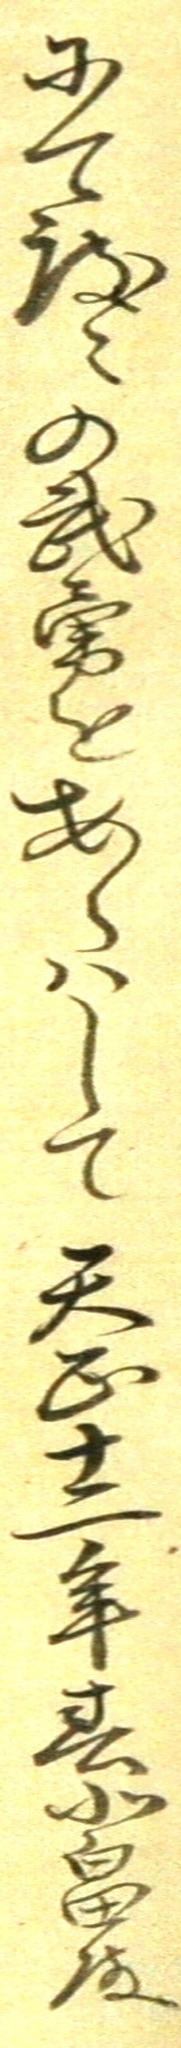にて度々の武勇をあらはして天正十二年春北畠殿

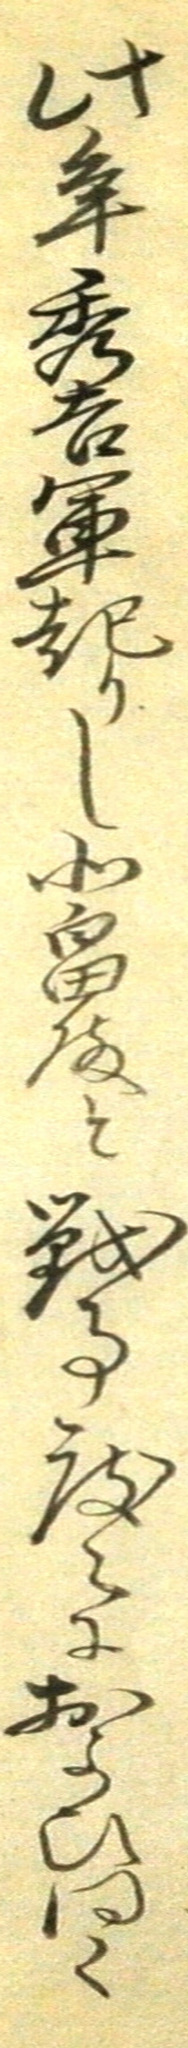此年秀吉軍起りし北畠殿と戦事度々におよひ同く
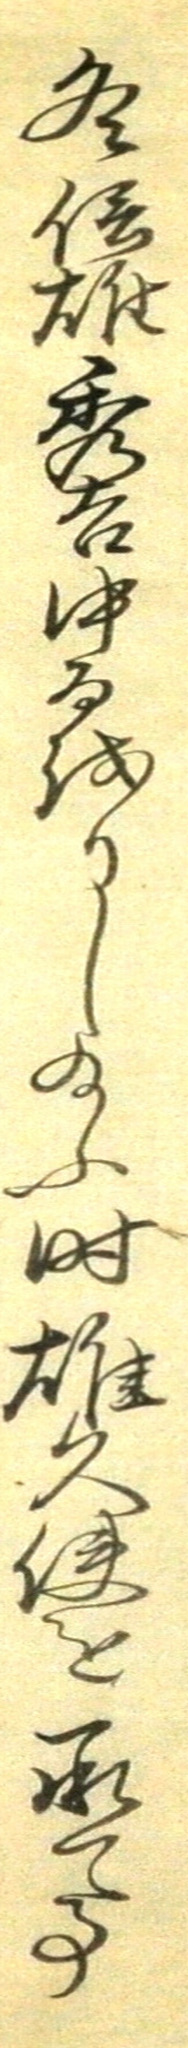冬信雄秀吉中なをりし給ふ時雄久使を承て事
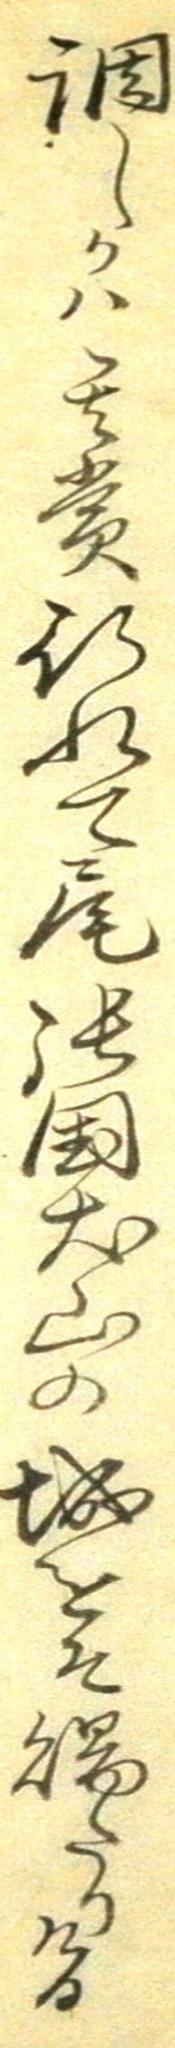調しかは其賞行れて尾張国犬山の城をそ賜たりける
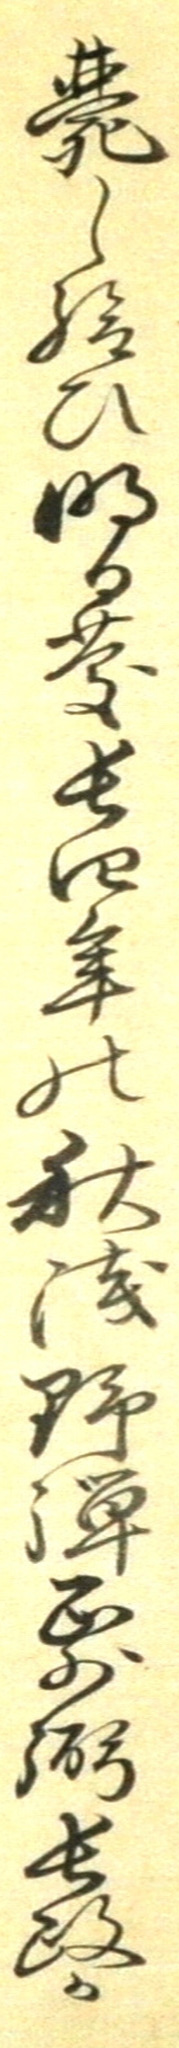薨し給ひ明る慶長四年の秋浅野弾正少弼長政か
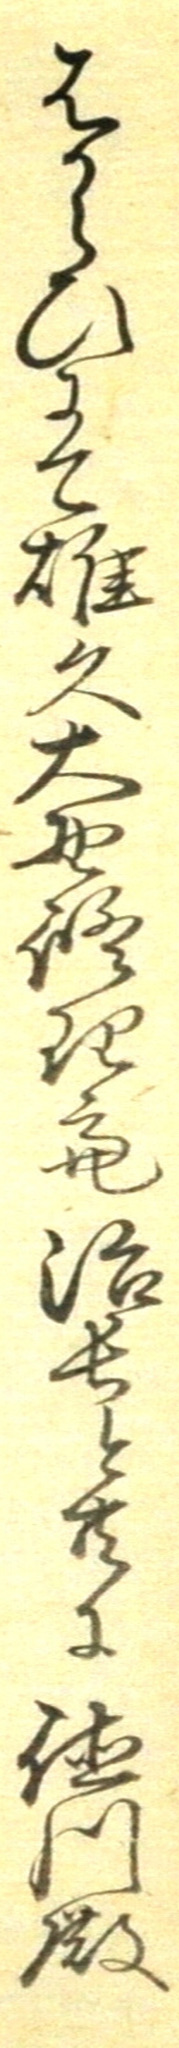はからひにて雄久大野修理亮治長と共に徳川殿
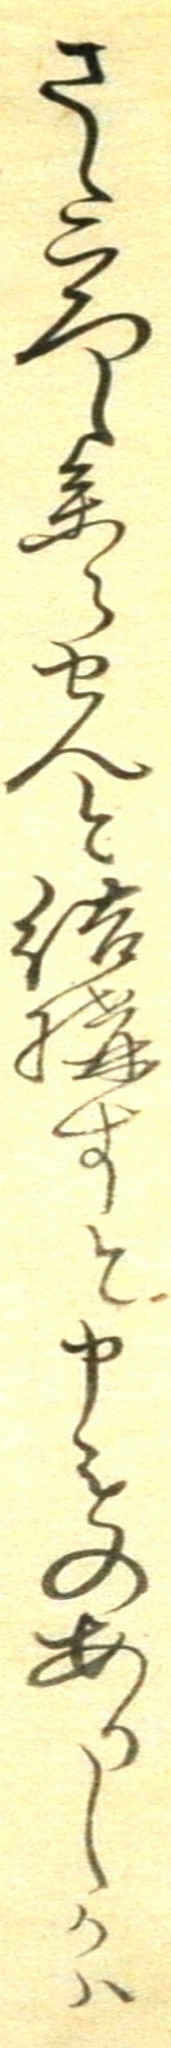さしころし参らせんと結構すと申ものありしかは
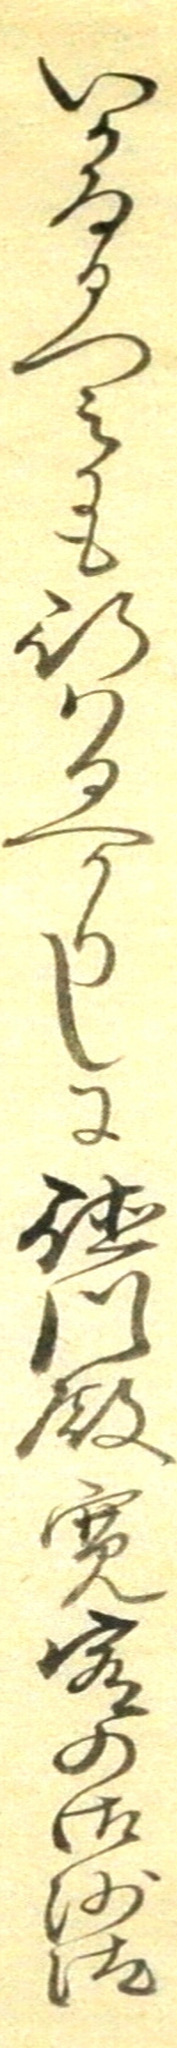いかなるつみにも行はるへかりしに徳川殿寛宥の御沙汰
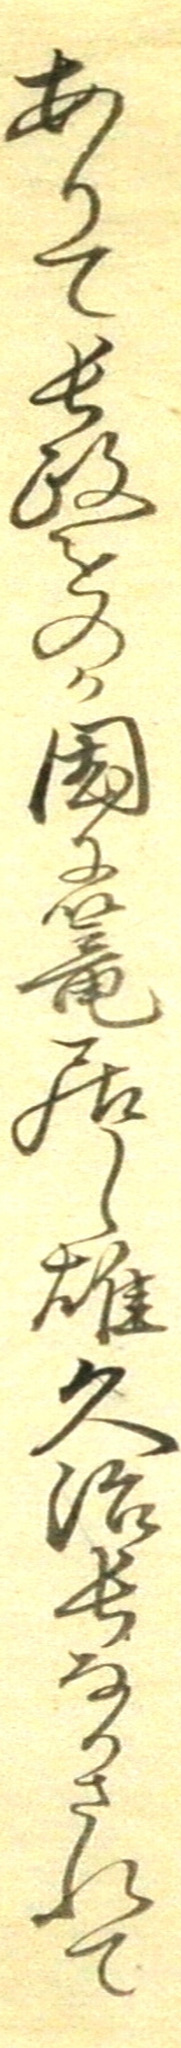ありて長政をのか国に籠居し雄久治長なかされて
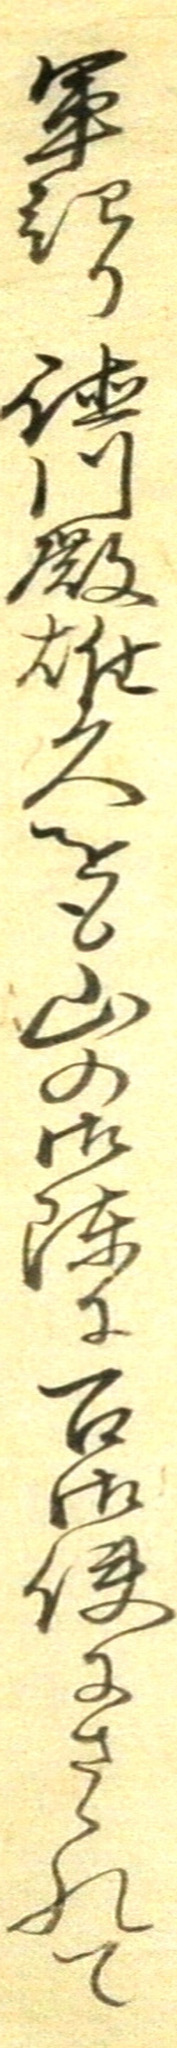軍起り徳川殿雄久をも山の御陣に召御使にさゝれて
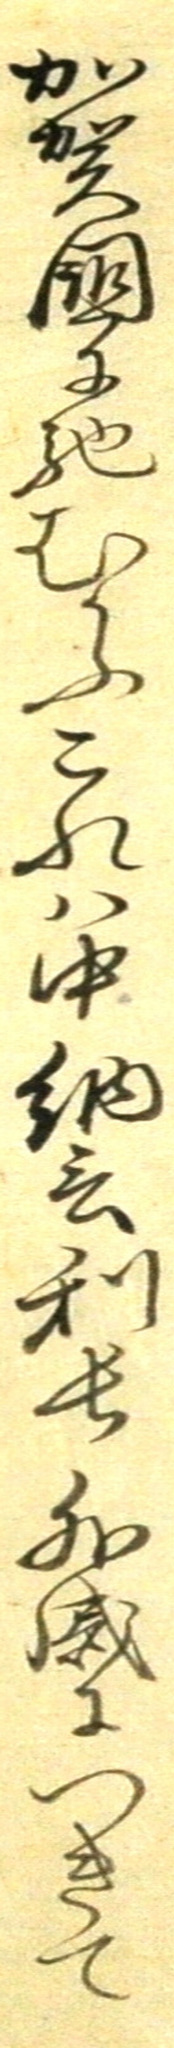加賀国に馳むかふこれは中納言利長外戚につきて
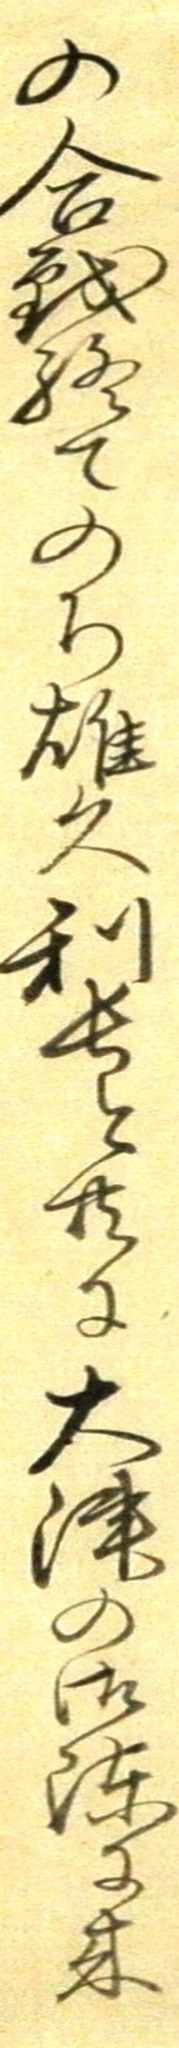の合戦終てのち雄久利長と共に大津の御陣に来
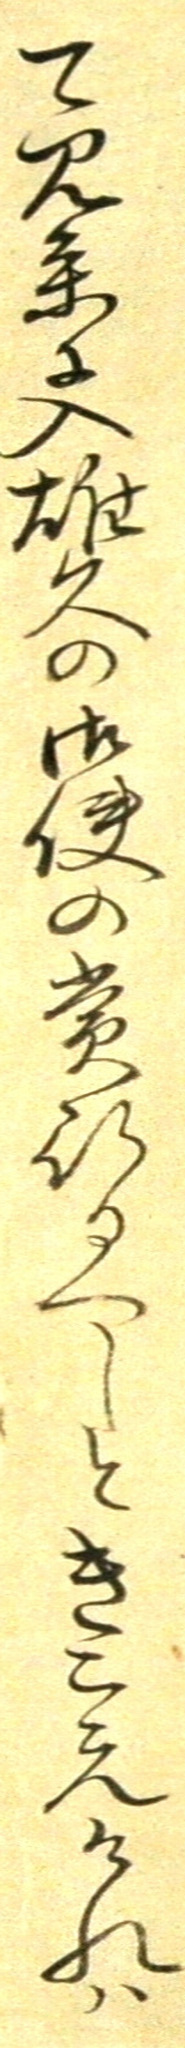て見参に入雄久の御使の賞行るへしときこえけれは
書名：藩翰譜（八・下）
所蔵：伊那市立高遠町図書館・合同会社AMANE
